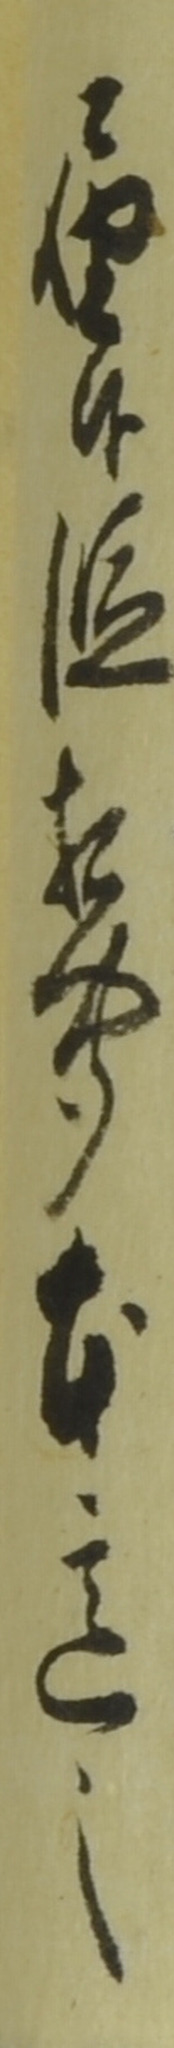届候段相聞本意之
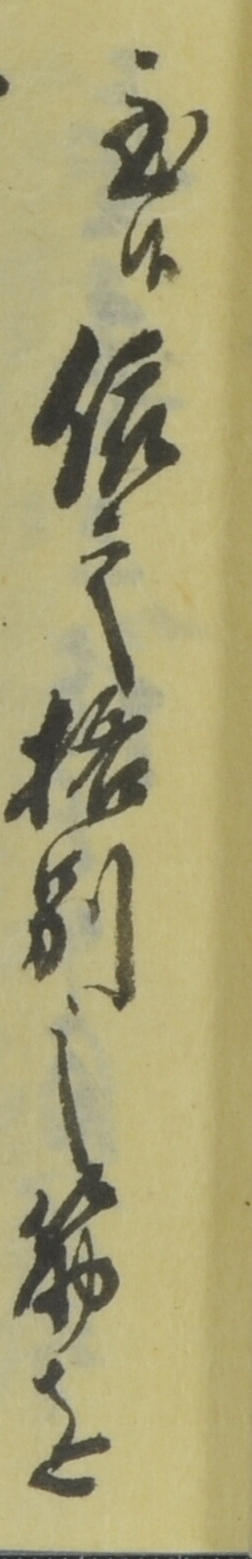至候依之格別之筋を
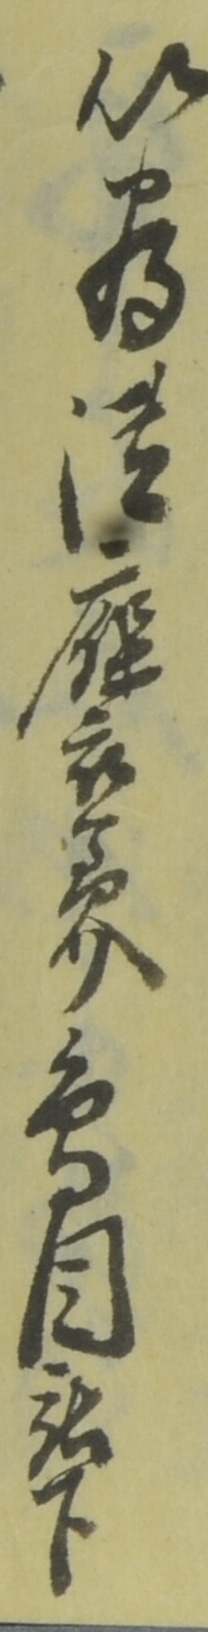以為御褒美鳥目被下

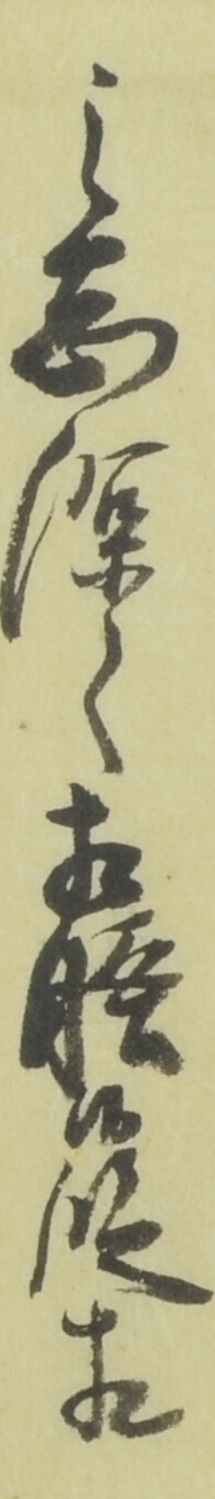之志深く相睦候段相
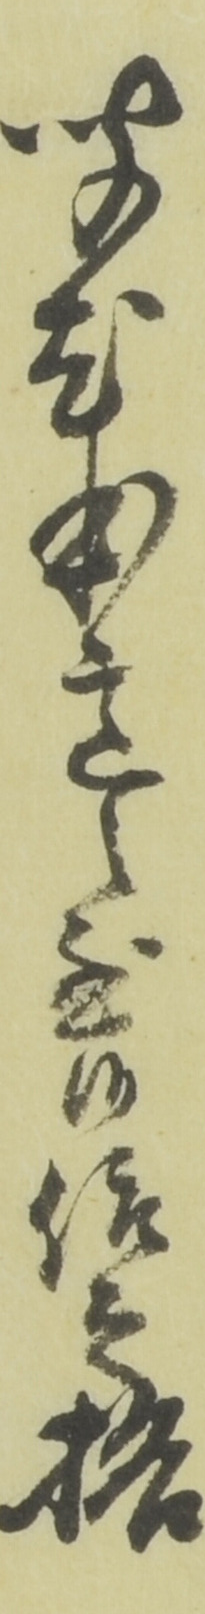聞尤本意之至候依之格
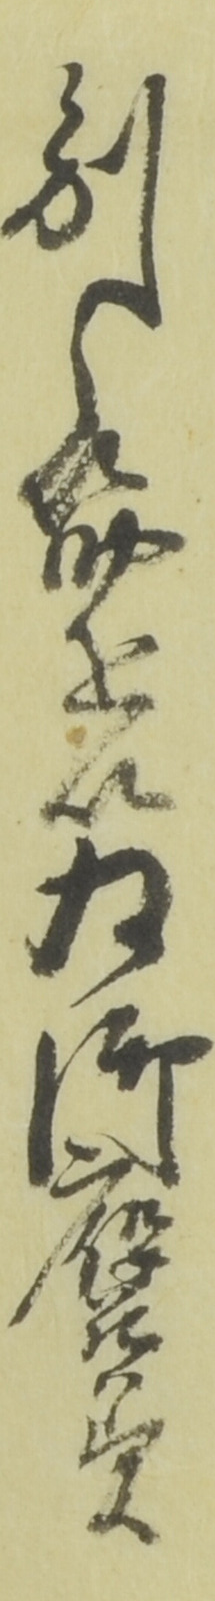別之筋を以為御褒美
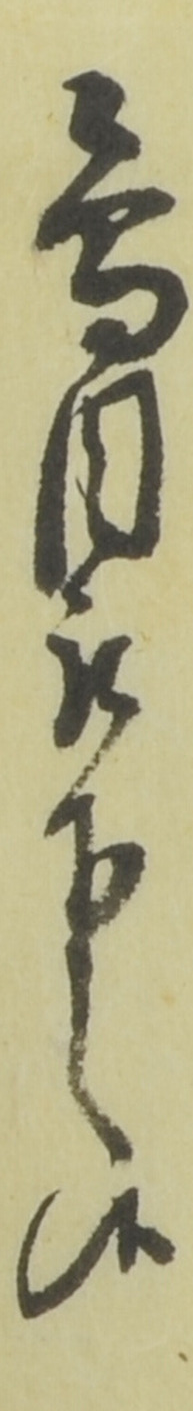鳥目被下之候
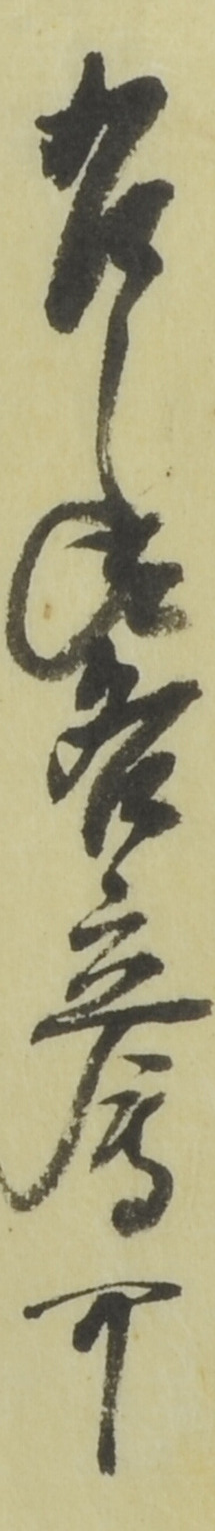右之趣各立会可
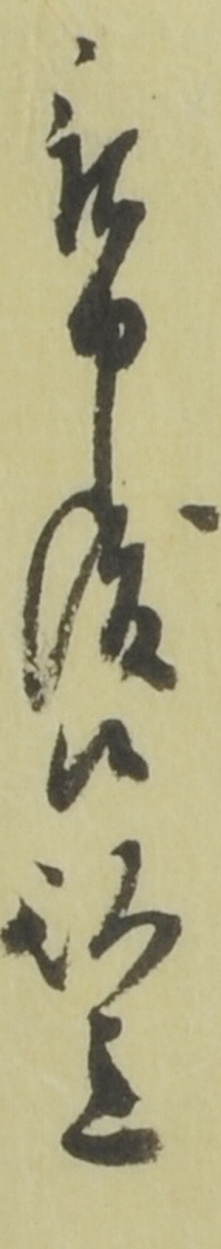被申渡候以上
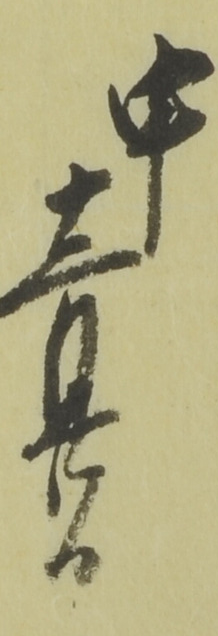十二月廿日
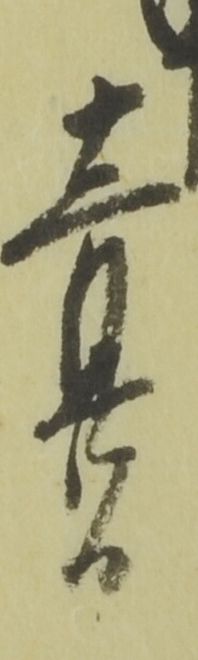十二月廿日
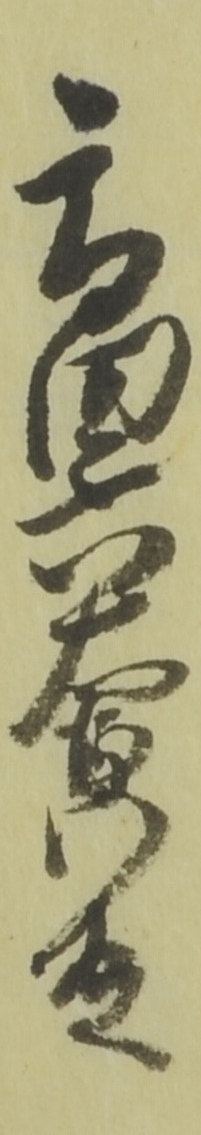高田六右衛門殿
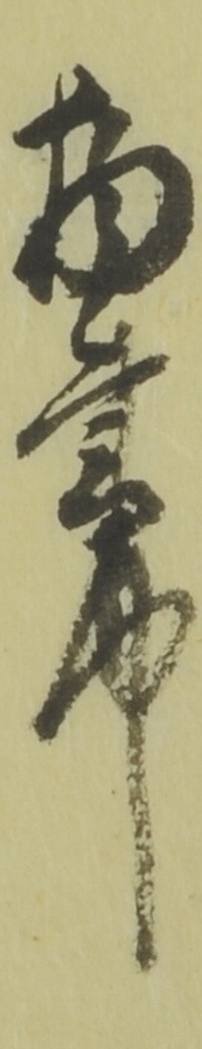物書中
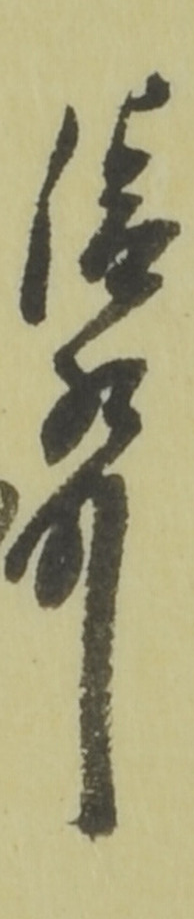清水町
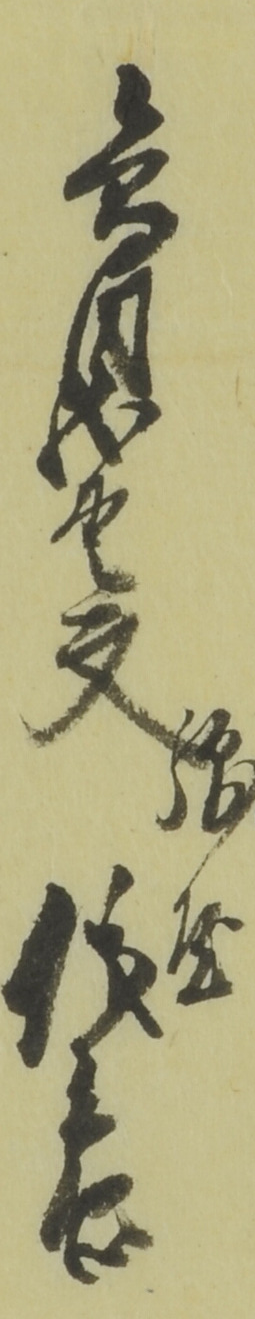鳥目弐貫文儀兵衛
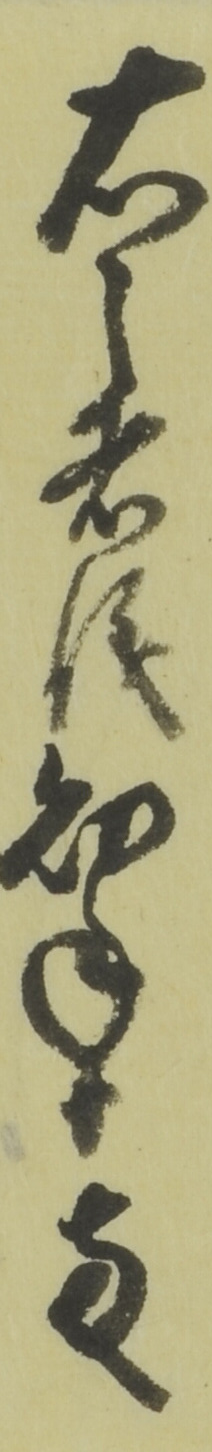右之者儀幼年ゟ両
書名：御触書御書附控
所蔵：伊那市立高遠町図書館・合同会社AMANE
